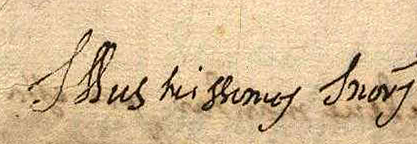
Illustrissimos Snor̄s
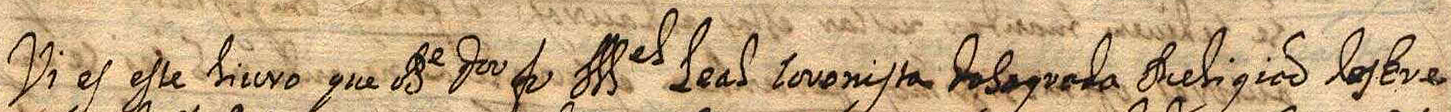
Vi es este liuro que o Pe Dor fr Mel Leal Coronista da Sagrada Religiaõ dos Ere
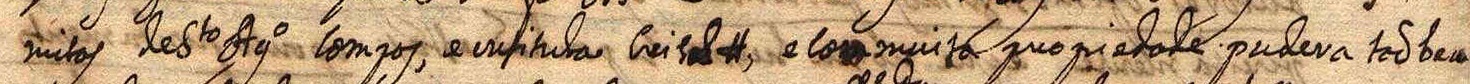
mitas de Sto Ago compos, e intitula Crisol tt., e com muita propiedade pudera taõbem
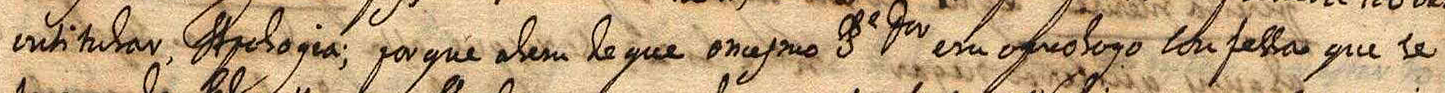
intitular, Apologia; porque alem de que o mesmo Pe Dor em o prologo confessa que se
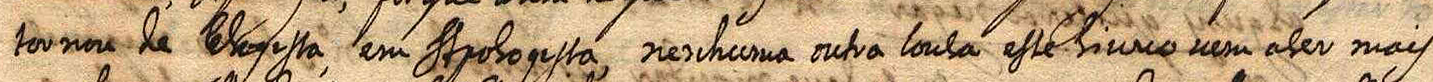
tornou de Elegista, em Apologista, nenhuma outra cousa este liuro uem a ser mais
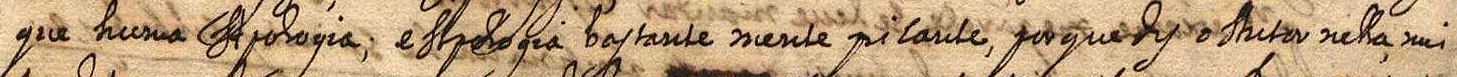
que huma Apologia, e Apologia bastantemente picante, porque dis o Autor nella, mui
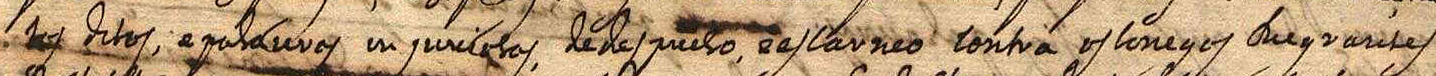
tos ditos, e palauras injuriosas, de despreso, e escarneo contra os conegos Regrantes
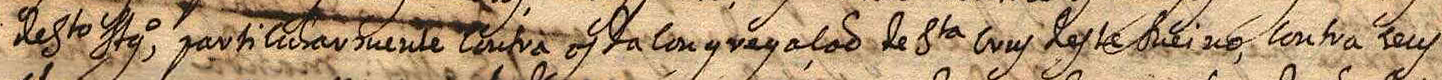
de Sto Ago, particularmente contra os da congregaçaõ de Sta crus deste Reino, contra seus
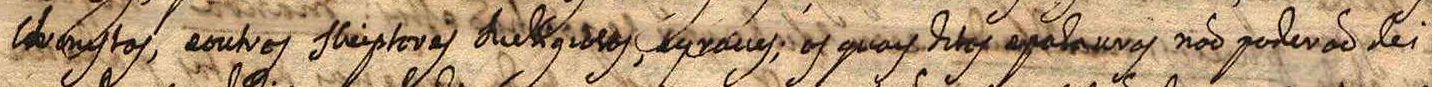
Chronistas, e outros scriptores Religiosos, e graues; os quais ditos e palauras naõ poderaõ dei
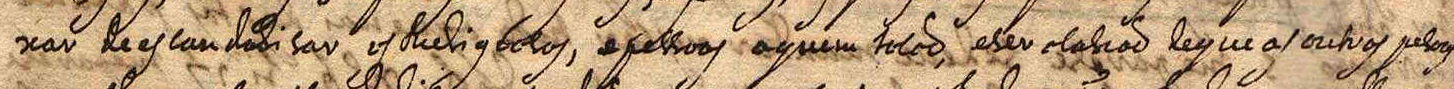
xar de escandalisar os Religiosos, e pessoas a quem tocaõ, e ser ocasiaõ de que as outras pesoas
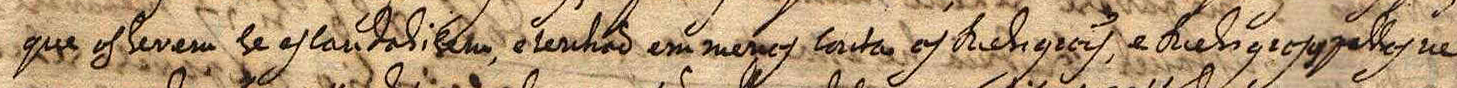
que os lerem se escandalisem, e tenhaõ em menos conta as Religioĩs, e Religiosos pellos ue
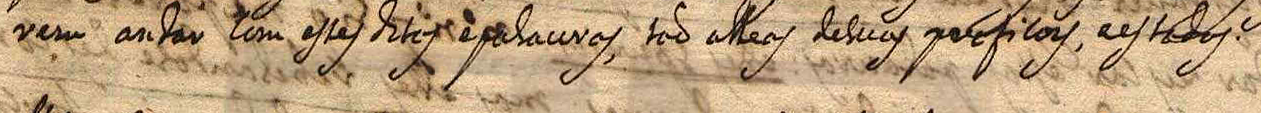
rem andar com estes ditos e palauras, taõ alheas de suas profiçois, e estados.
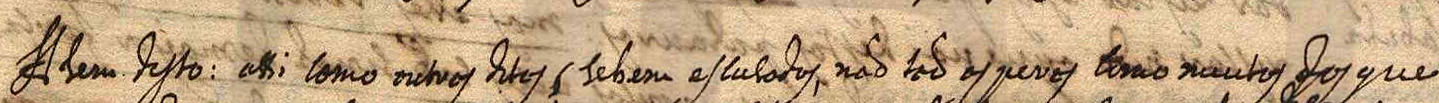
Alem disto: assi como outros ditos (se bem escusados, naõ taõ asperos como muitos dos que
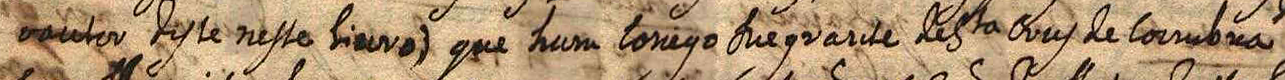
o autor disse neste liuro) que hum conego Regrante de Sta crus de Coimbra
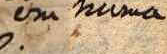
em huma
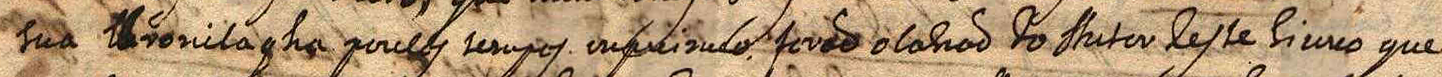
sua Chronica q ha poucos tempos inprimio foraõ ocasiaõ do Autor deste liuro que
